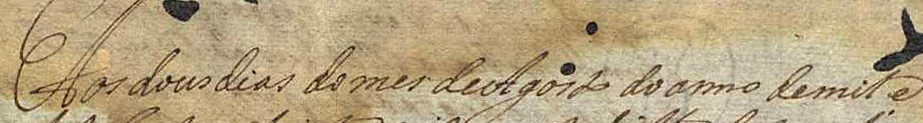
Aos dous dias do mes de Agosto do anno de mil e
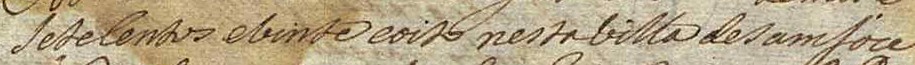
seteCentos e vinte e oito nesta villa de sam Joze
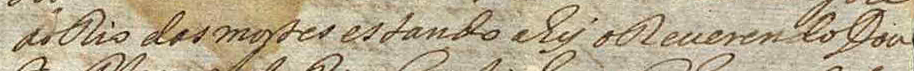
ao Rio das mortes estando ahy o Reuerendo Dou
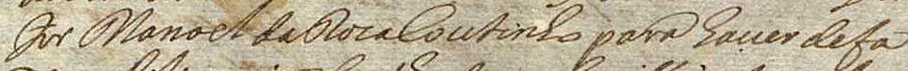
tor Manoel da Roza Coutinho para hauer de fa
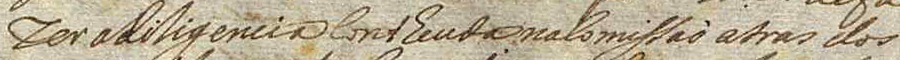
zer a diligencia Contheuda na Comissaõ atras dos
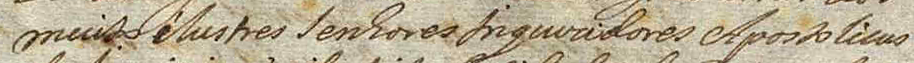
muito èlustres senhores Inquizidores Apostolicus
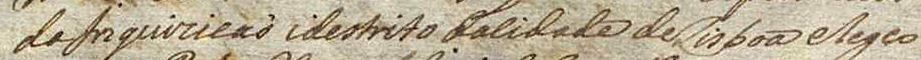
da Jnquiziçaõ e destrito da cidade de Lisboa elegeo
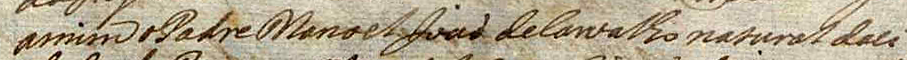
a mim o Padre Manoel Joaõ de Carvalho natural da ci
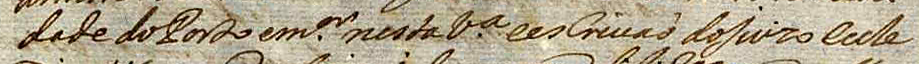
dade do Porto e m.or nesta V.a e esCriuaõ do Juizo eccle
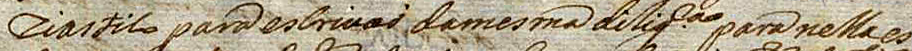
ziastico para escrivaõ da mesma dilig.ça para nella es
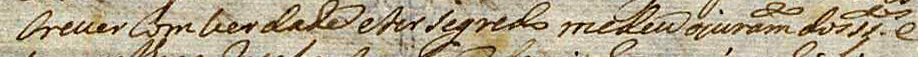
Creuer com verdade e ter segredo me deu o juramto dos s.tos e
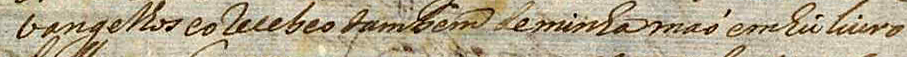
vangelhos e o Recebeo tambem de minha maõ em hū liuro
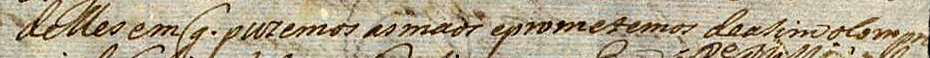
a elles em q̄. puzemos as maos e prometemos de asim o compr
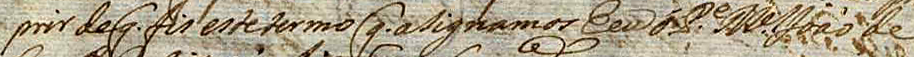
prir de q̄. fis este termo q̄ asignamos E eu o P.e M.el Joaõ de
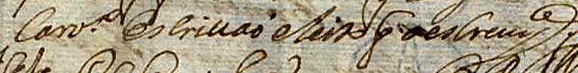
Carv.o Escriuaõ eleito q̄ o esCreuy.
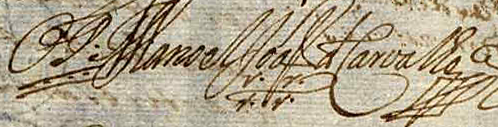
O P. Manoel Joaõ d̄ Carvalho
